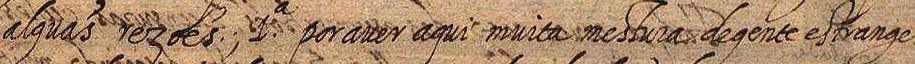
alguas̄ rezoes̄; 1.a por auer aqui muita mestura de gente estrangei
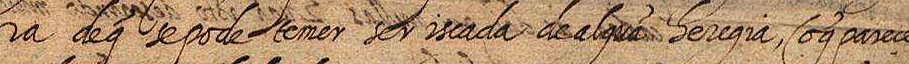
ra de q̄ se pode temer ser iscada de alguā heregia, (o q̄ parece
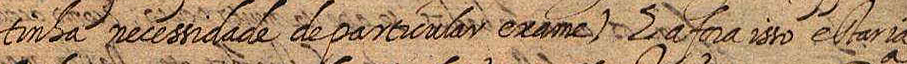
tinha necessidade de particular exame) E afora isso estaria
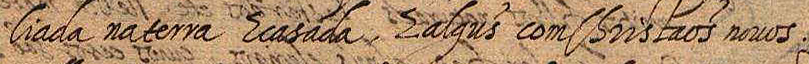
liada na terra E casada E algus̄ com Christaõs nouos.
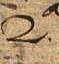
2.a
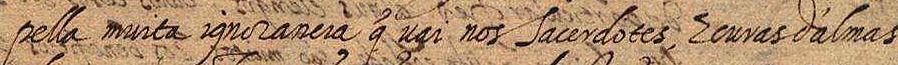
pella muita ignorancia q̄ uai nos Sacerdotes, E curas d'almas
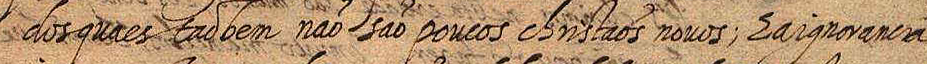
dos quaes taõbem naõ saõ poucos christaõs nouos; E a ignorancia
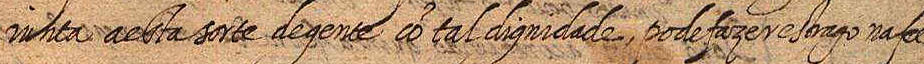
iunta a esta sorte de gente cō tal dignidade, pode fazer estrago na fee.
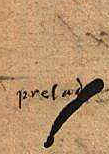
prelad
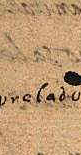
prelado
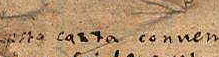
esta carta conuem
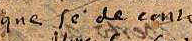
que se de conta
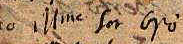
ao illmo sor bpō
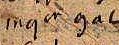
inqor gal
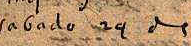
sabado 24 de
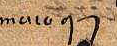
maio 97
